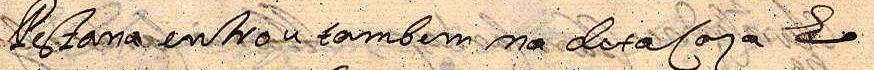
Pestana entrou tambem na dita Caza E
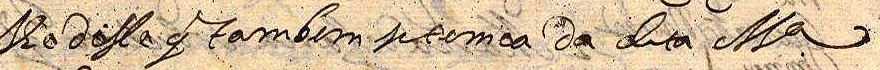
lhe disse q̄ tambem se temia da dita Ma.
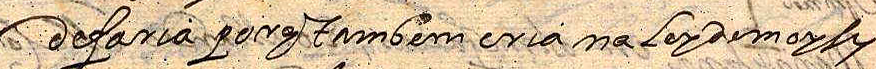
de faria porq̄ tambem cria na Ley de moyses
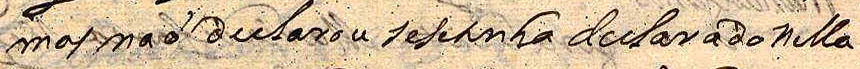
mas naõ declarou se se tinha declarado nella
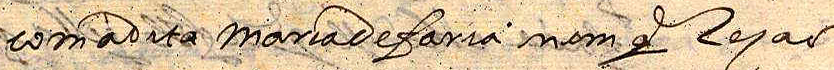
com a dita maria de faria nem q̄ Rezaõ
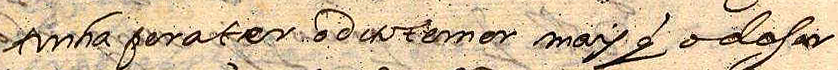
tinha para ter o dito temor mais q̄ o de ser
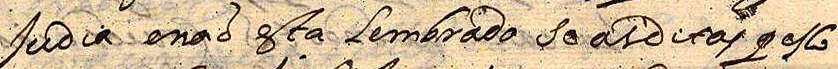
Judia e naõ esta Lembrado se as ditas pesso
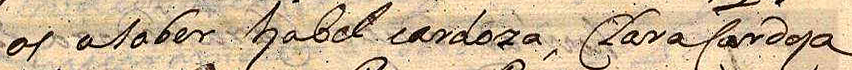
as a saber Izabel cardoza, Clara Cardoza
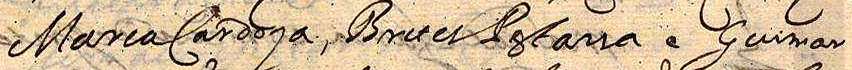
Maria Cardoza, Brites Pestana e Guimar
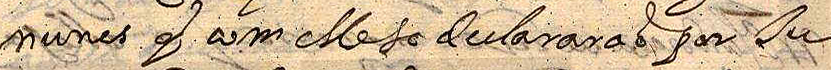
nunes q̄ com elle se declararaõ por Iu
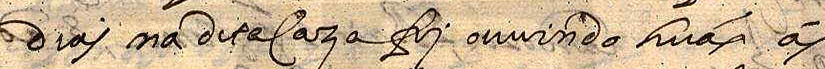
dias na dita Caza foj ouuindo huas̄ ás
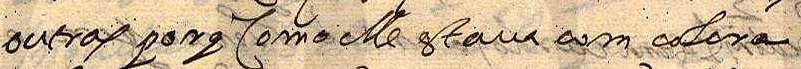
outras porq̄ Como elle estaua com colera
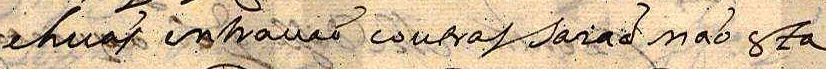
e huas̄ entrauaõ e outras saiaõ naõ esta
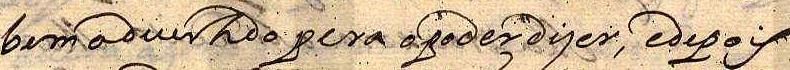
bem aduertido pera o poder dizer, e depois
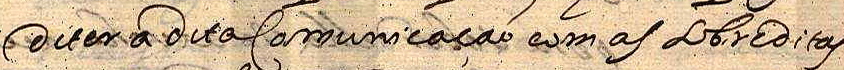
de ter a dita Comunicaçaõ com as sobreditas
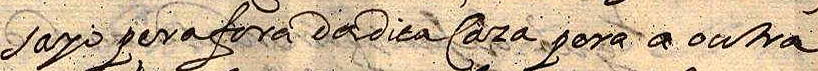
sayo pera fora da dita Caza pera a outra
